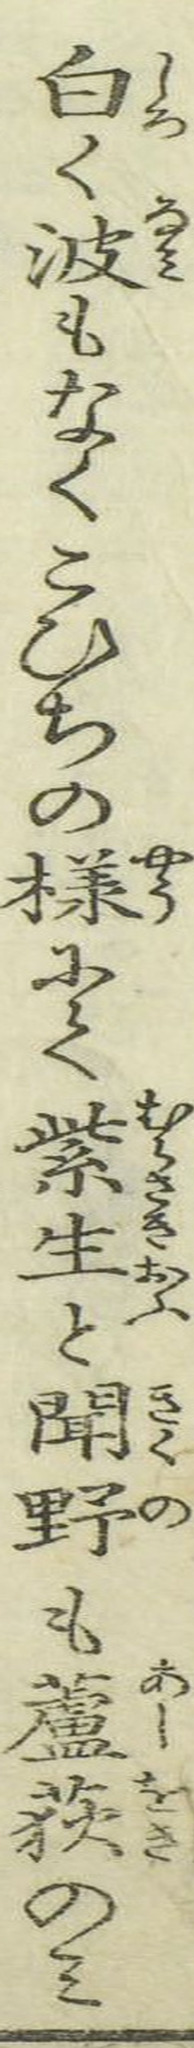白く波もなくこひちの様にて紫生と聞野も蘆荻のみ
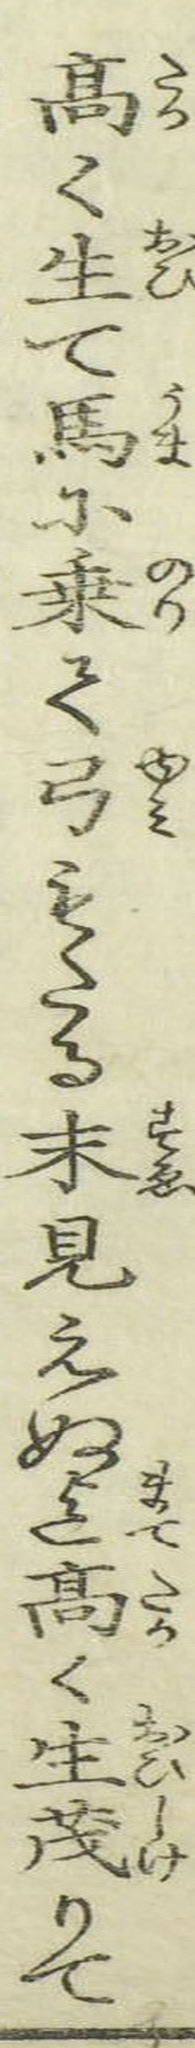高く生て馬に乗て弓もたる末見えぬ迄高く生茂りて
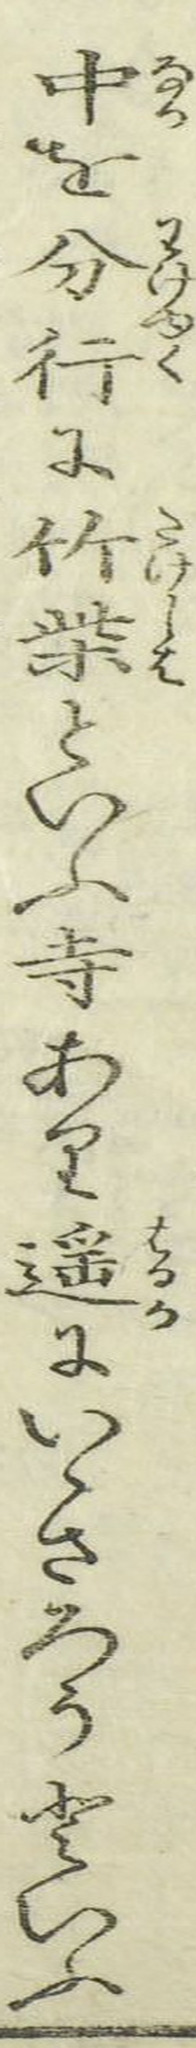中を分行に竹柴といふ寺あり遥にいゝさろうといふ
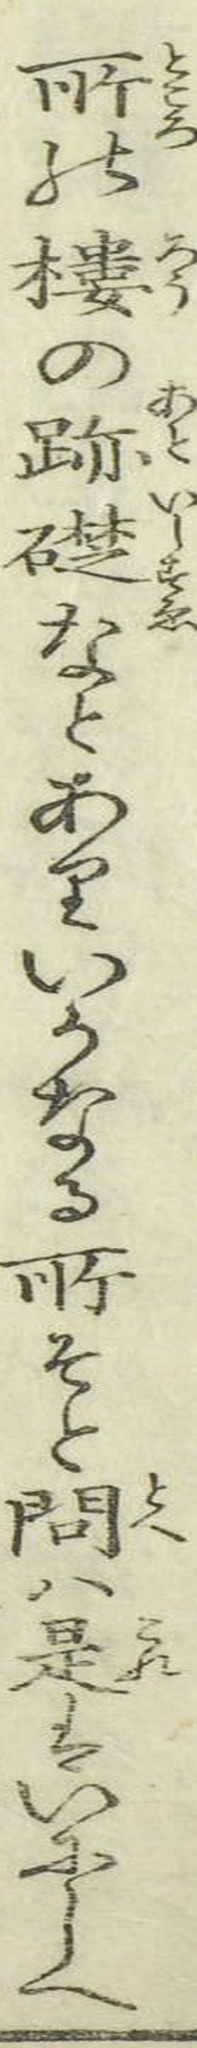所の楼の跡礎なとありいかなる所そと問は是はいにしへ
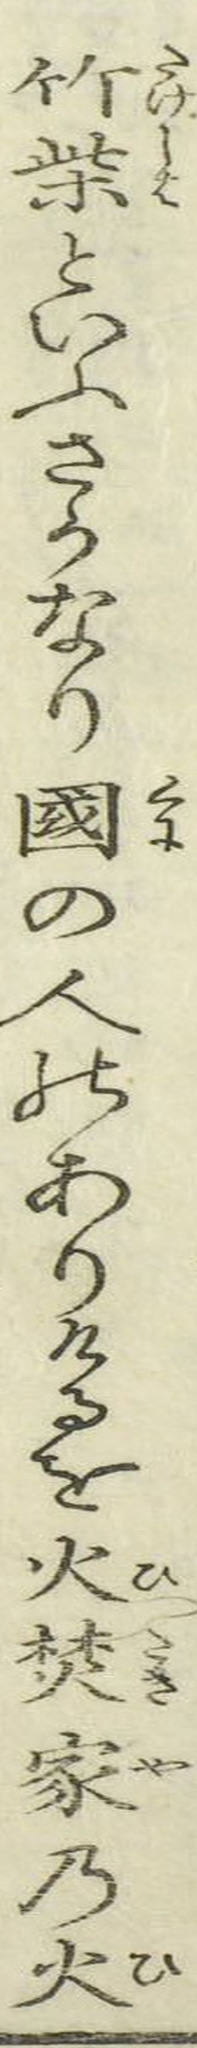竹柴といふさかなり國の人のありけるを火焚家の火
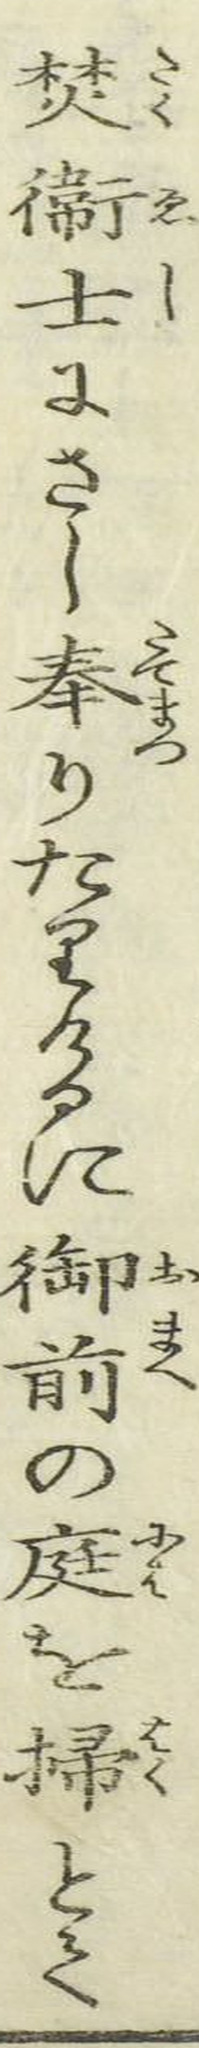焚衛士にさし奉りたりけるに御前の庭を掃とて
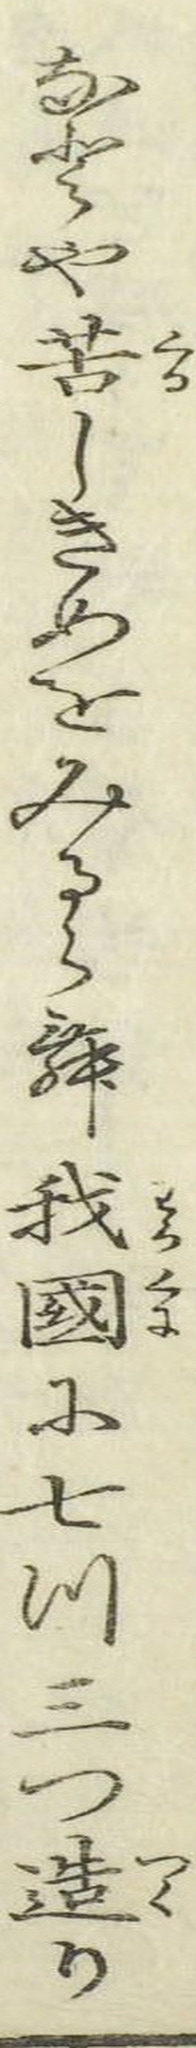なとや苦しきめをみるらむ我國に七つ三つ造り
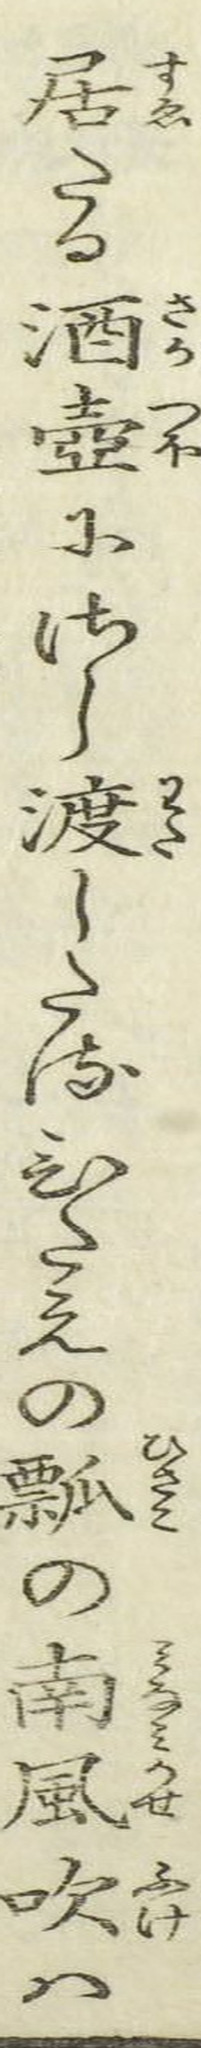居たる酒壺にさし渡したるひたえの瓢の南風吹は
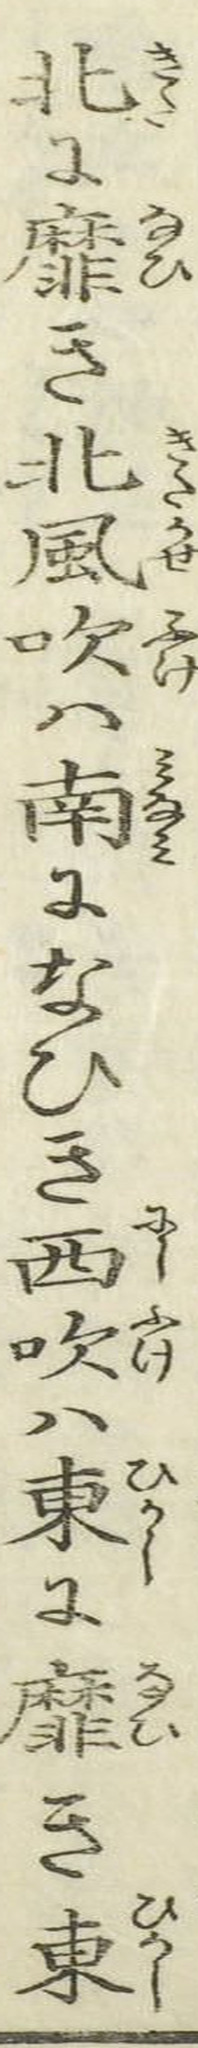北に靡き北風吹は南になひき西吹は東に靡き東
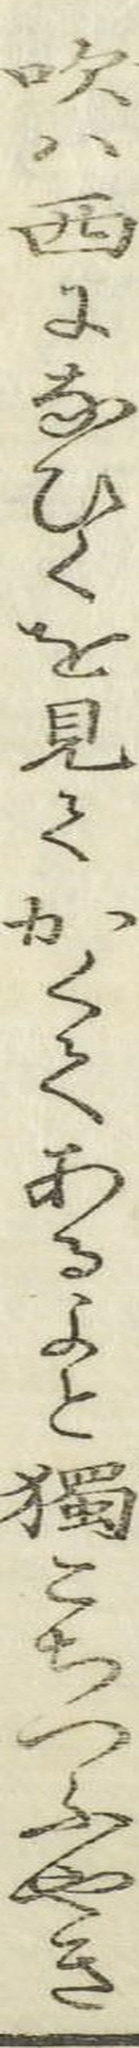吹は西になひくを見てかくてあるよと獨こちつふやき
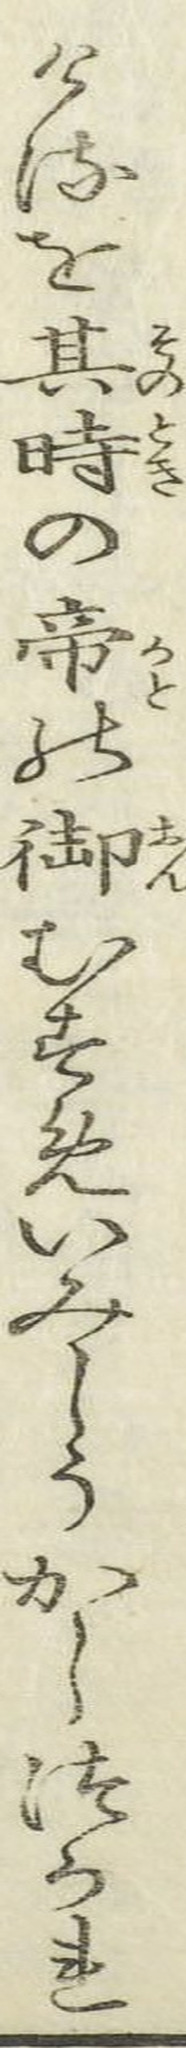けるを其時の帝の御むすめいみしうかしつかれ
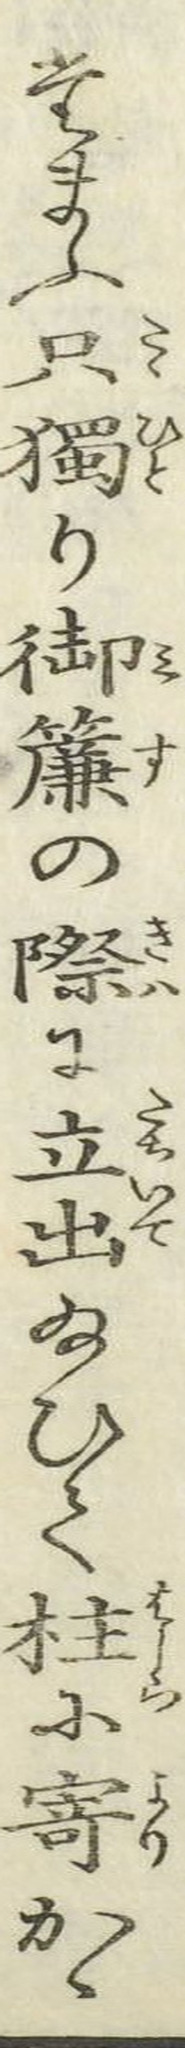たまふ只獨り御簾の際に立出給ひて柱に寄かゝ
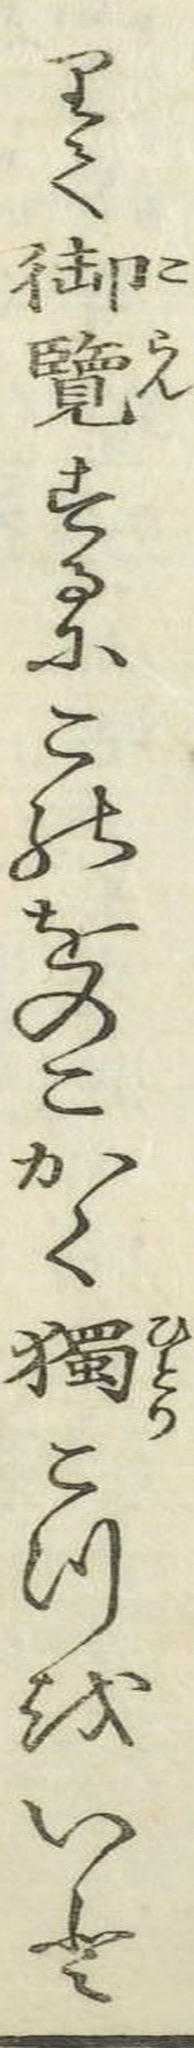りて御覧するにこのをのこかく獨こつをいと
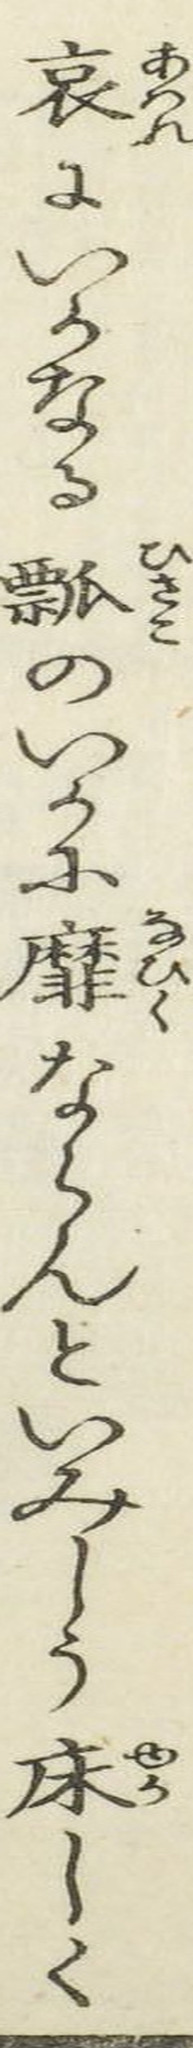哀にいかなる瓢のいかに靡ならんといみしう床しく
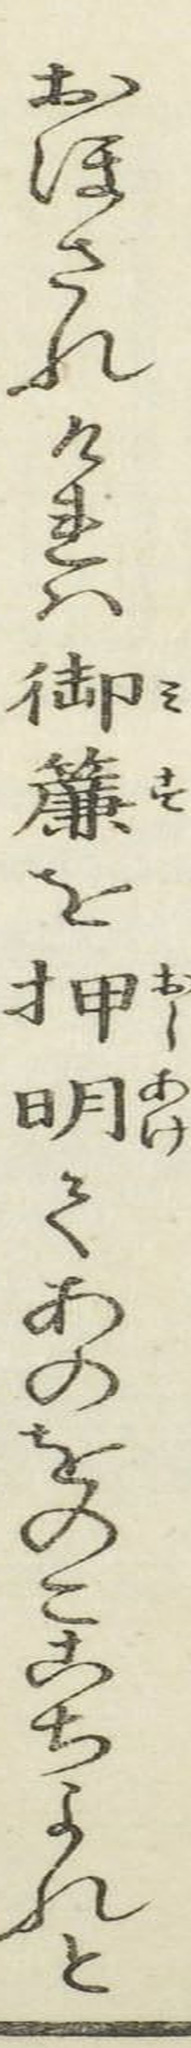おほされけれは御簾を押明てあのをのここちよれと
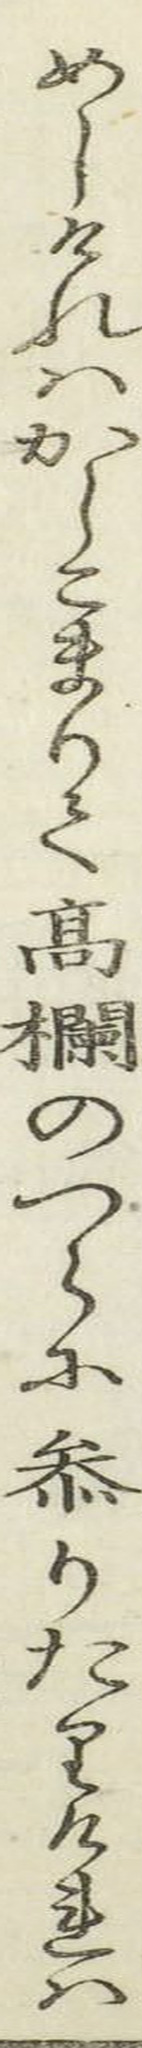めしけれはかしこまりて高欄のつらに参りたりけれは
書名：江戸名所図会 20巻 巻之3
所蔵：東京学芸大学教育コンテンツアーカイブ
